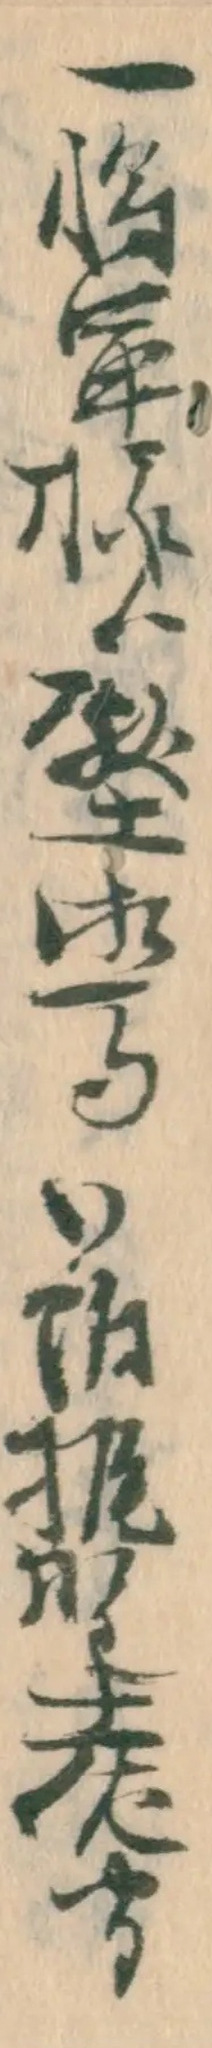一将軍様ゟ献上御馬御附梶野土佐守
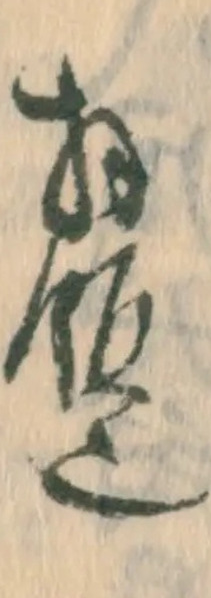拝領也
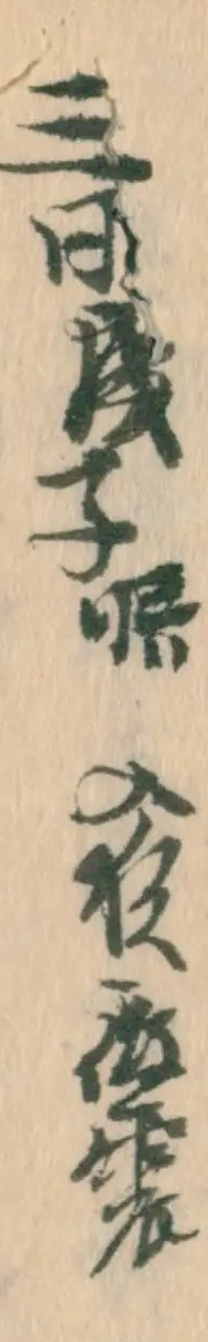三日戊子晴入夜微震
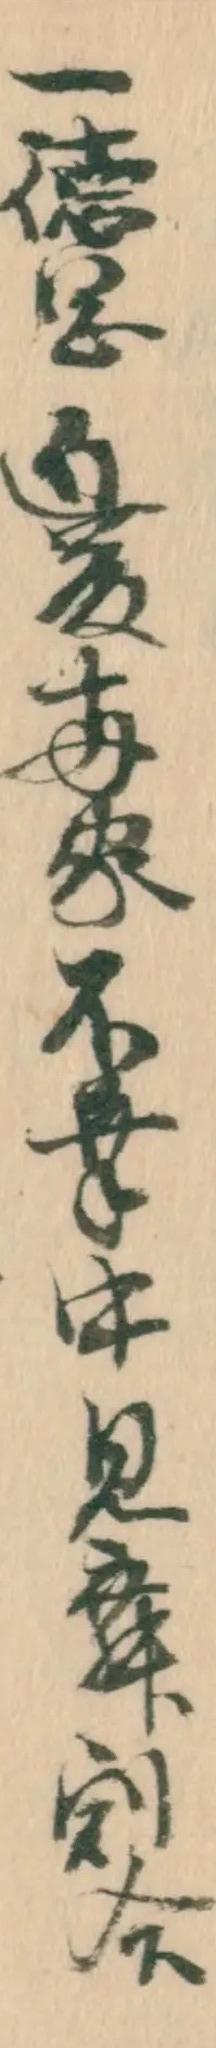一徳岡近藤両家不幸中見舞割合
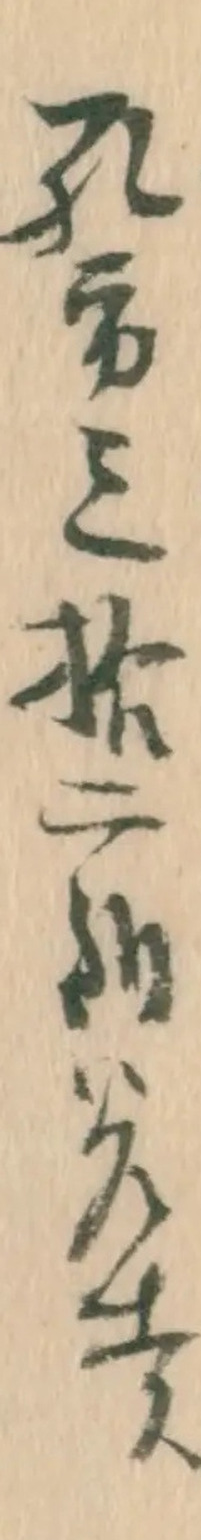孔方三拾二銅差出ス
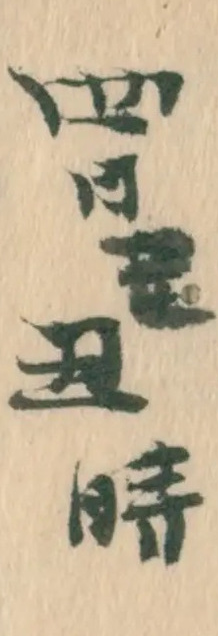四日己丑晴
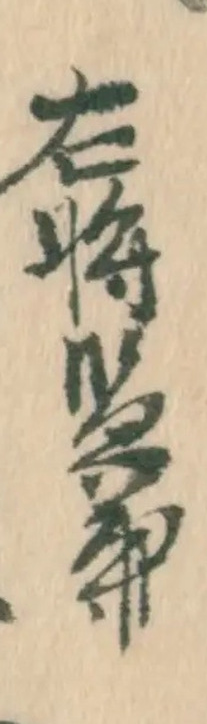右将監兼
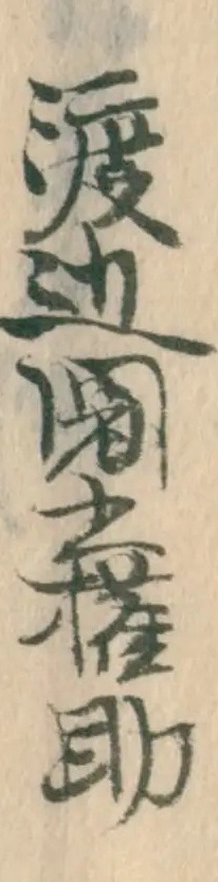一渡辺図書権助
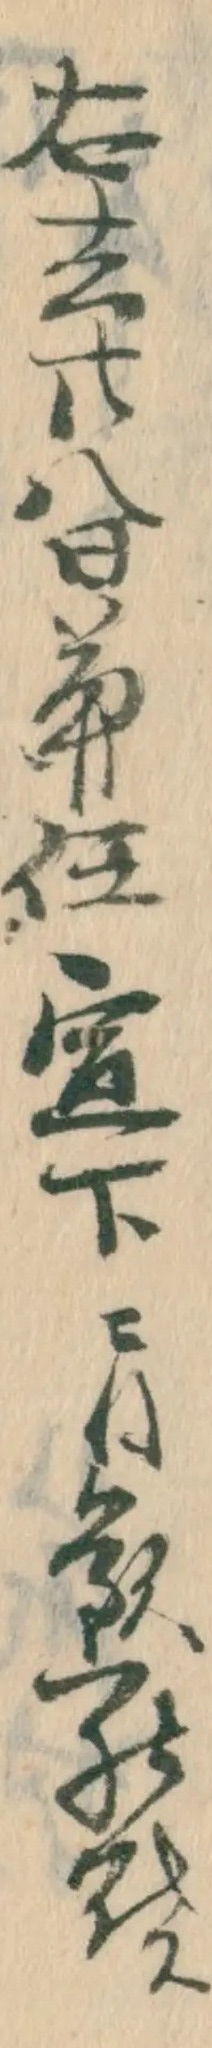右去廿八日兼任宣下ニ付歓罷越ス

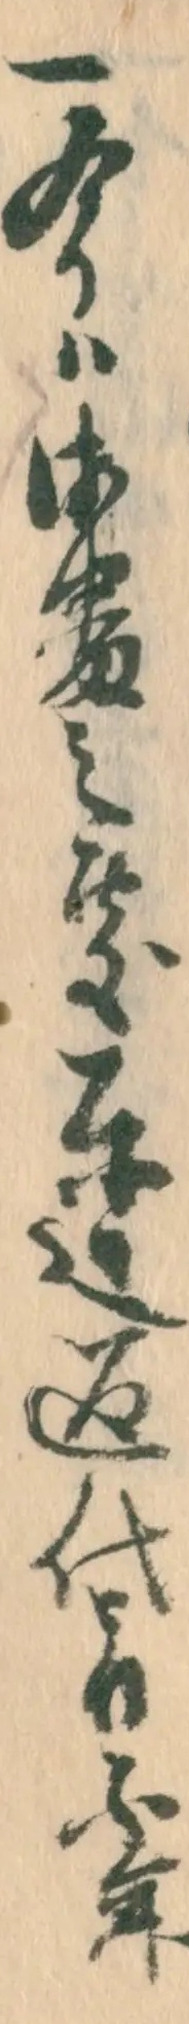一今日御番之処東辻返代ニ付不参
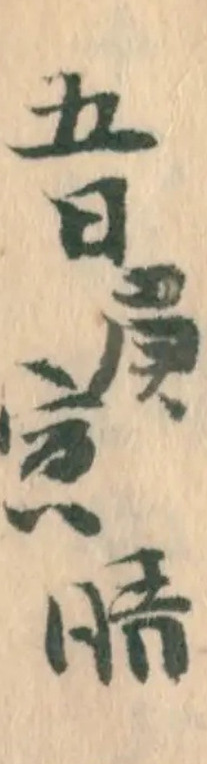五日庚寅晴
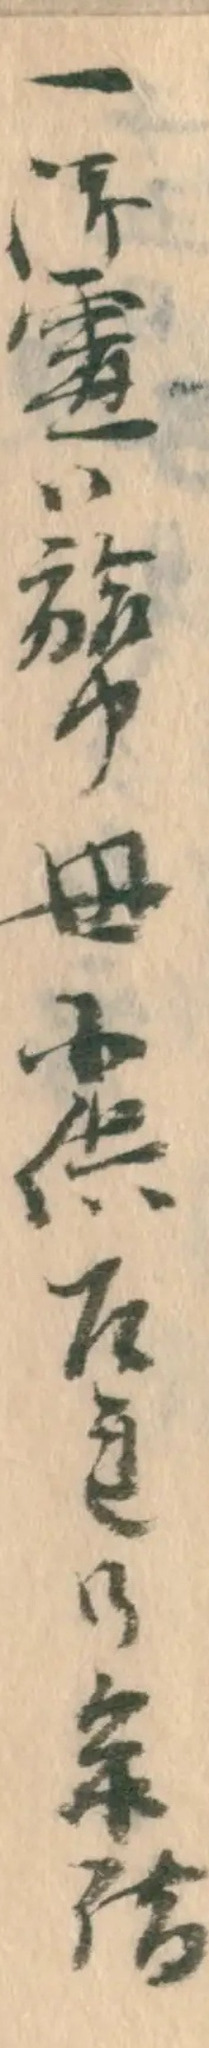一御霊御旅中母子供召連御参詣
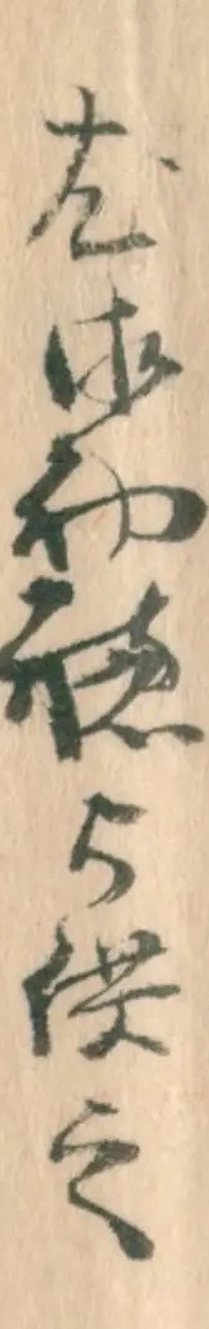尤御初穂被供之
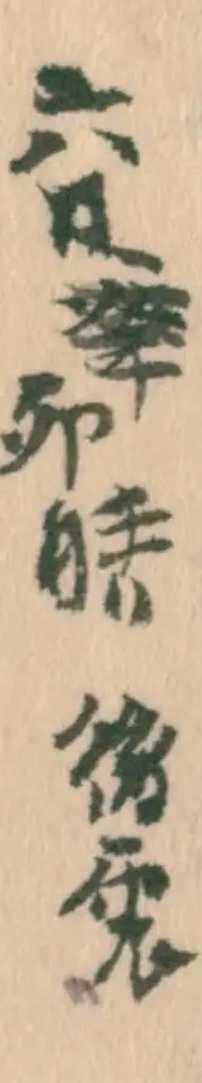六日辛卯晴微震
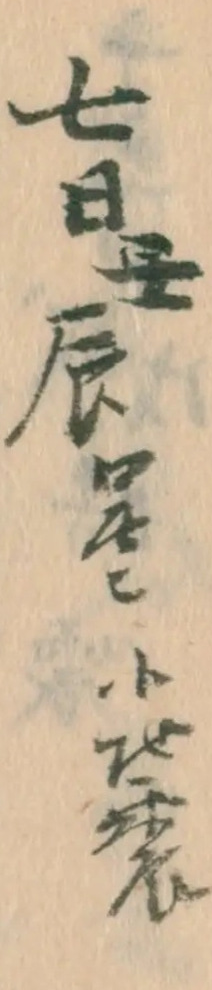七日壬辰曇小地震
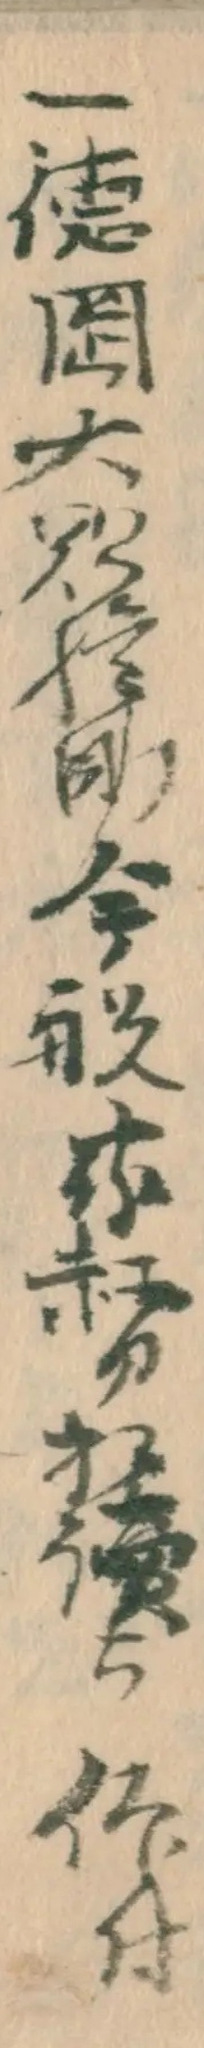一徳岡大炊権助今般家督相続被仰付
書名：禁裏御所御用日記. [131]
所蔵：国立国会図書館 National Diet Library, JAPAN
